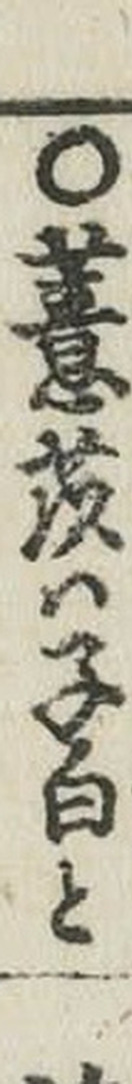○薏苡は子白と
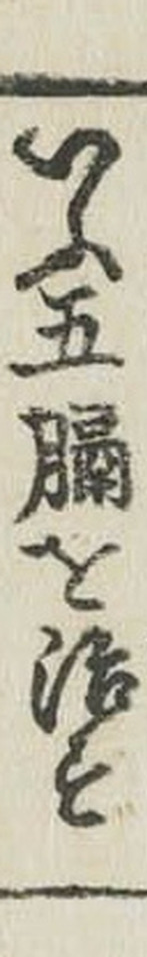いふ五膈を治す
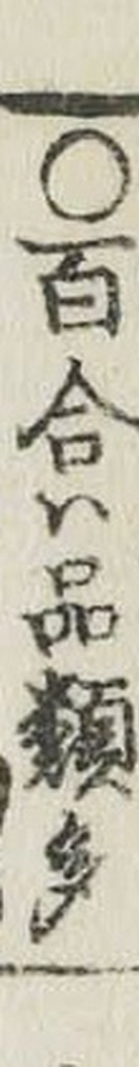○百合は品類多し
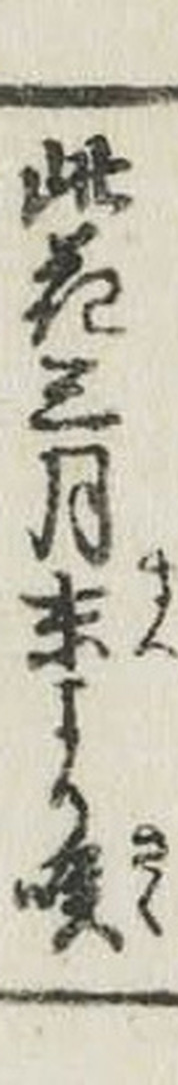此花三月末より咲
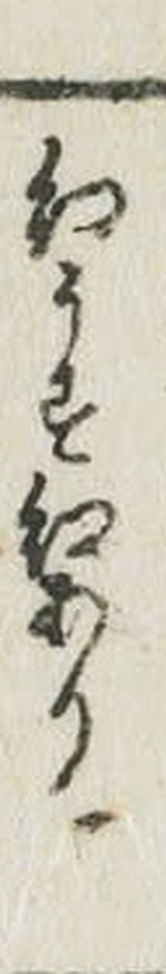紅うす紅あり
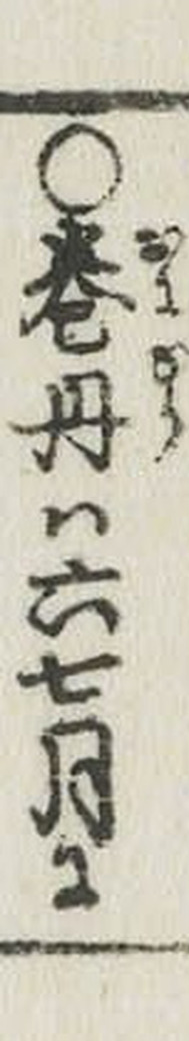○巻丹は六七月に
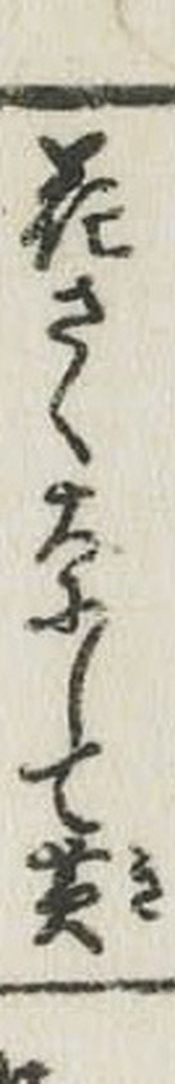花さく大にして黄
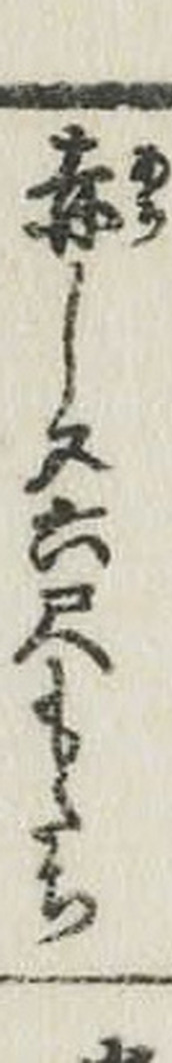赤し五六尺もたち
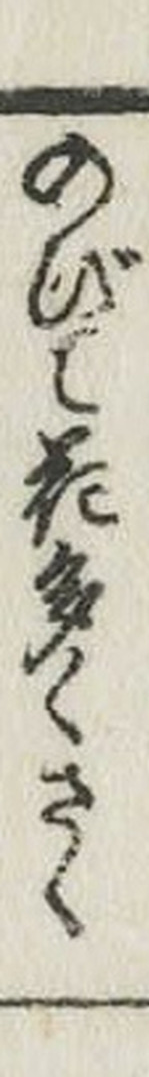のびて花多くさく
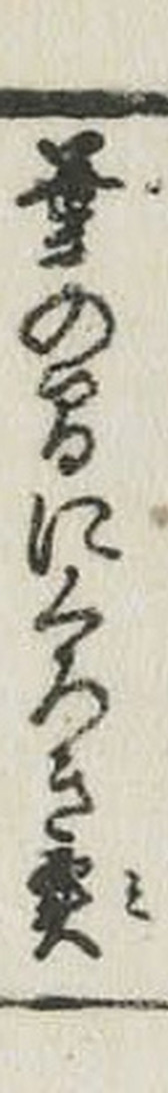葉の間にくろき実
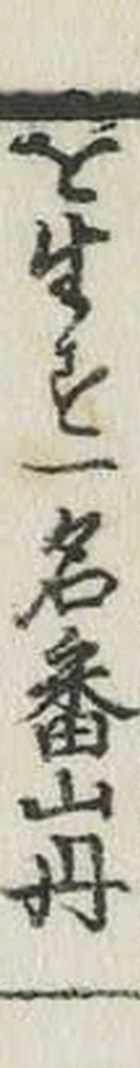を生す一名番山丹
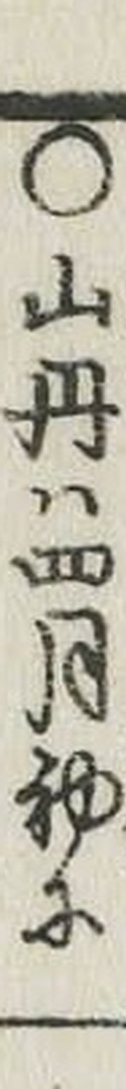○山丹は四月初に
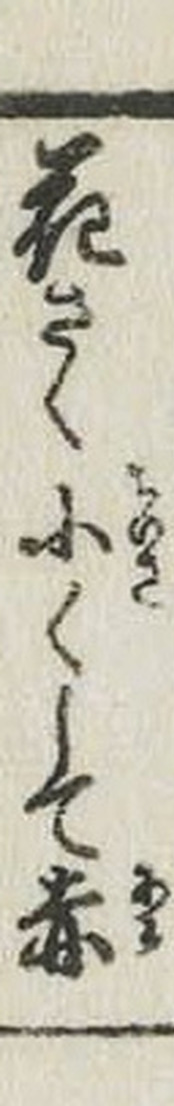花さく小くして赤
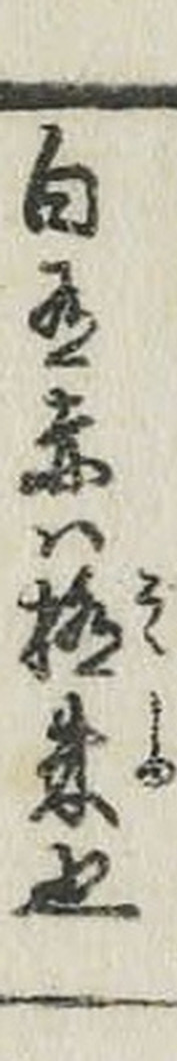白有赤は極朱也
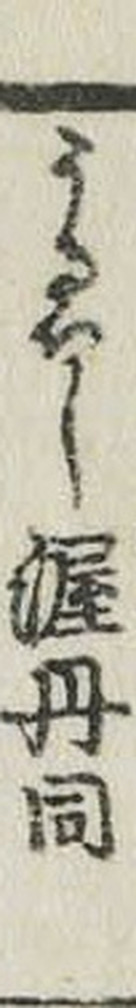うるはし渥丹同
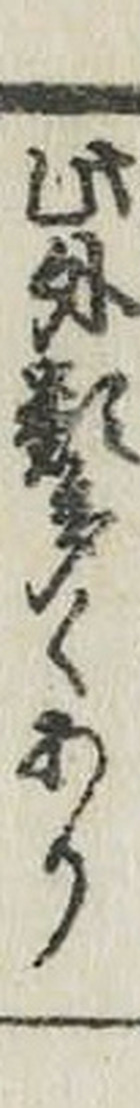此外類多くあり
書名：増補頭書訓蒙図彙大成 10巻 9:巻之20
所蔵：東京学芸大学教育コンテンツアーカイブ
